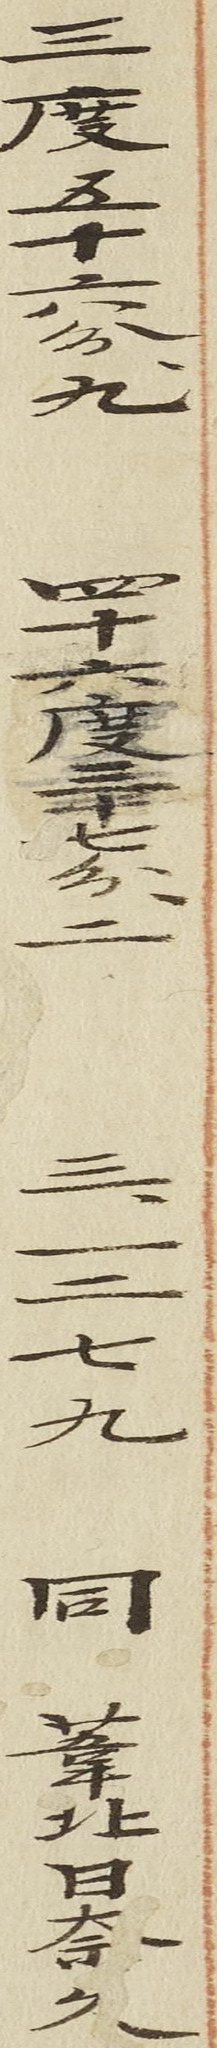三度五十六分、九四十六度三十七分、二三、一二七九同葦北日奈久
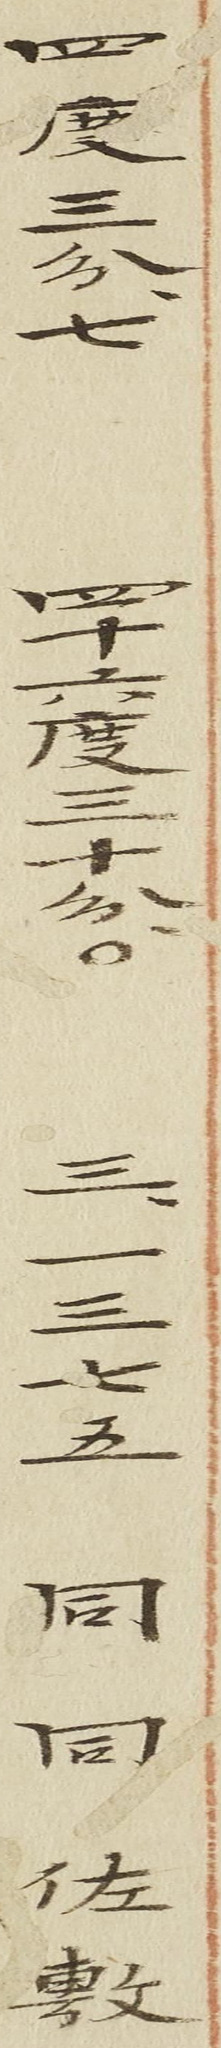四度三分、七四十六度三十分、〇三、一三七五同同佐敷
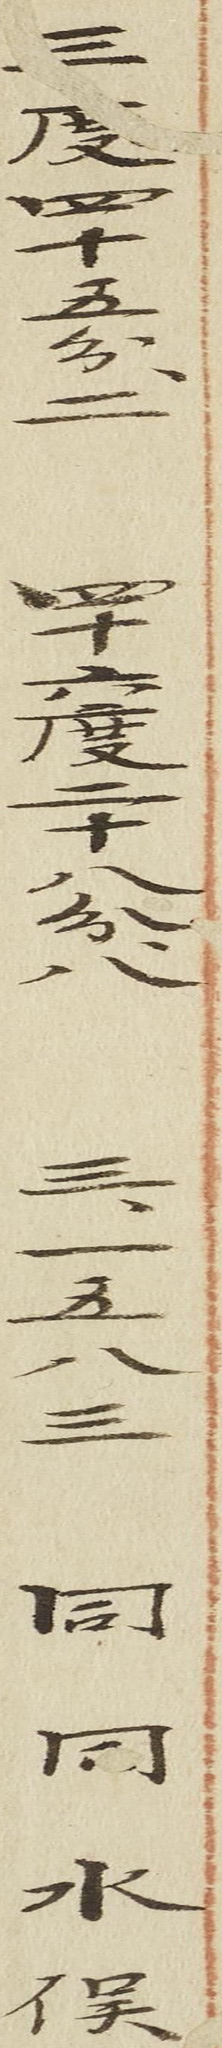三度四十五分、二四十六度二十八分、八三、一五八三同同水俣
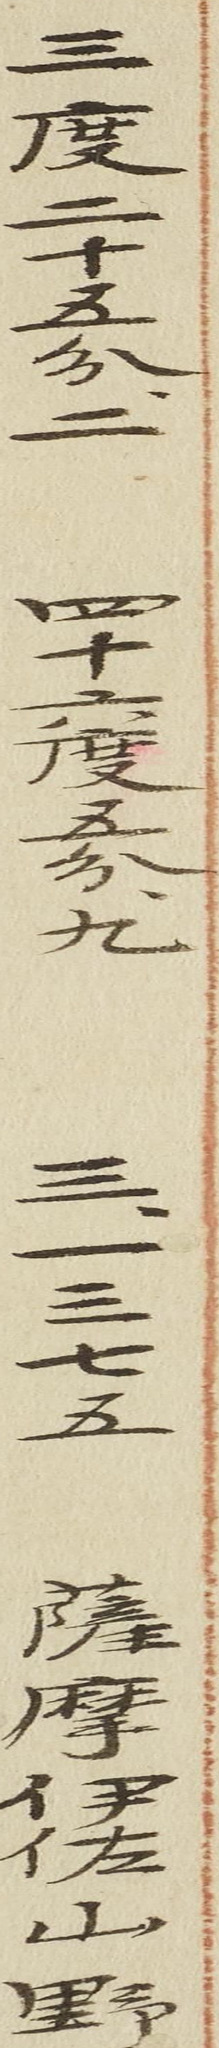三度二十五分、二四十六度五分、九三、一三七五薩摩伊佐山野
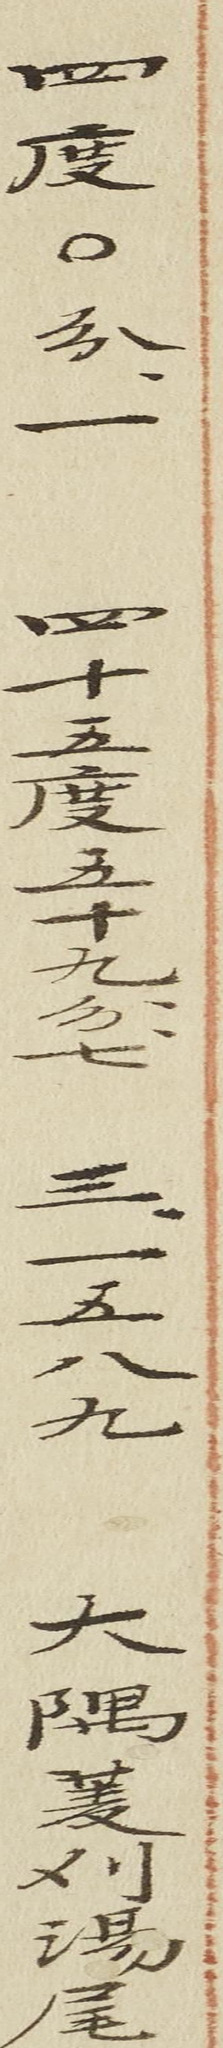四度〇分、一四十五度五十九分、七三、一五八九大隅菱刈湯尾
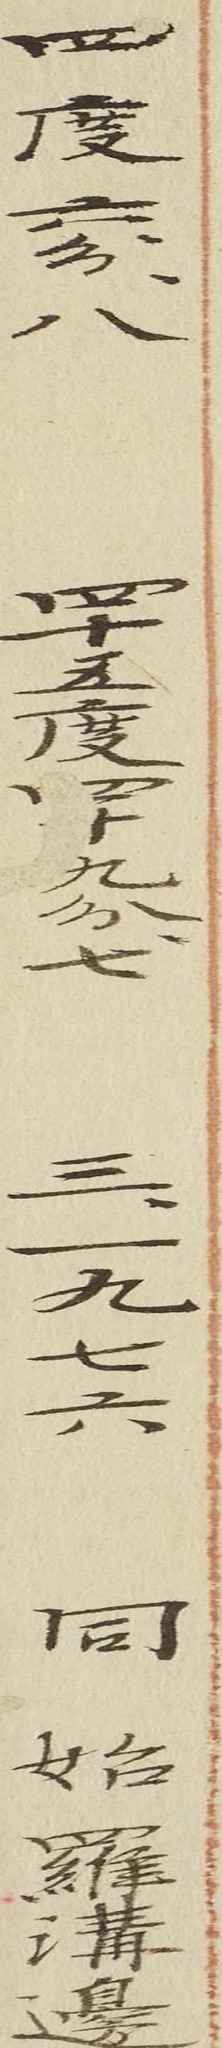四度六分、八四十五度四十九分、七三、一九七六同始羅溝辺
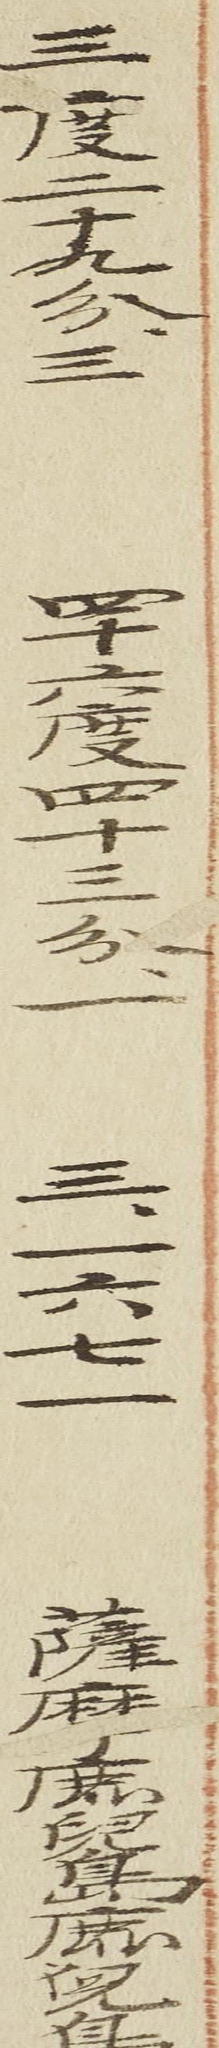三度二十九分、三四十六度四十三分、一三、一六七一薩摩鹿児島鹿児島
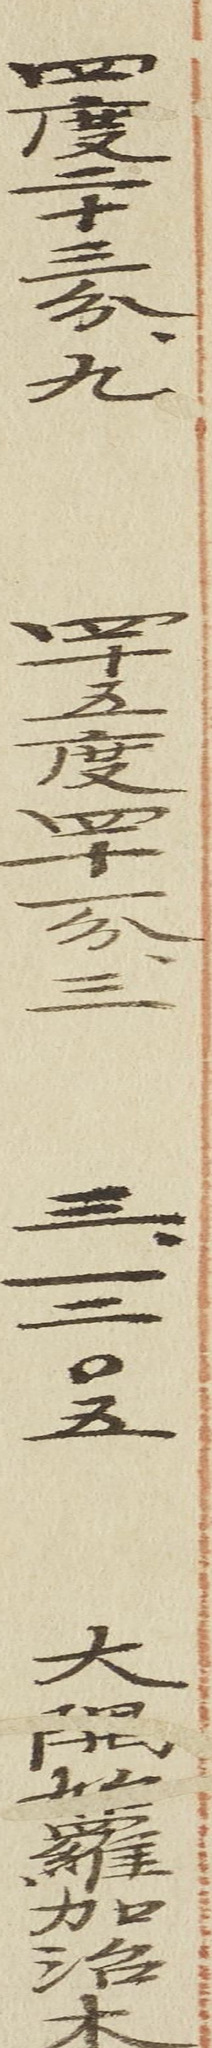四度二十三分、九四十五度四十一分、三三、一二〇五大隅始羅加治木
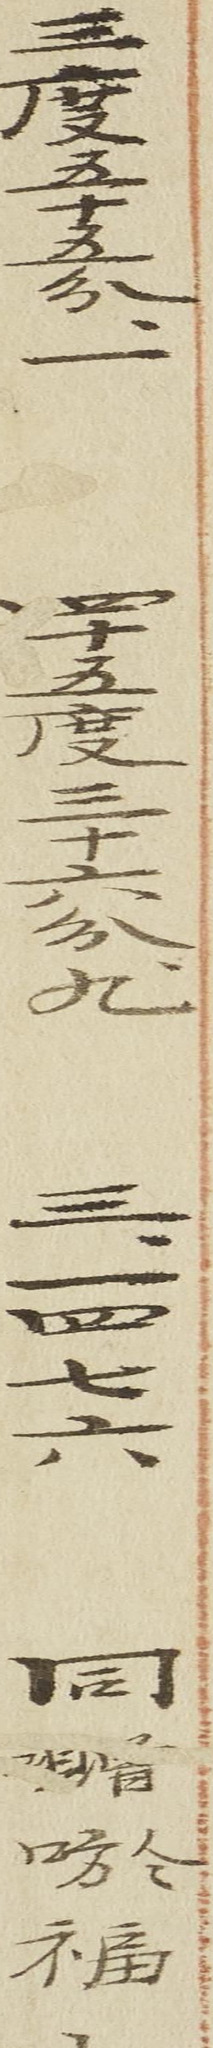三度五十五分、一四十五度三十六分、九三、一四七八同囎唹福山

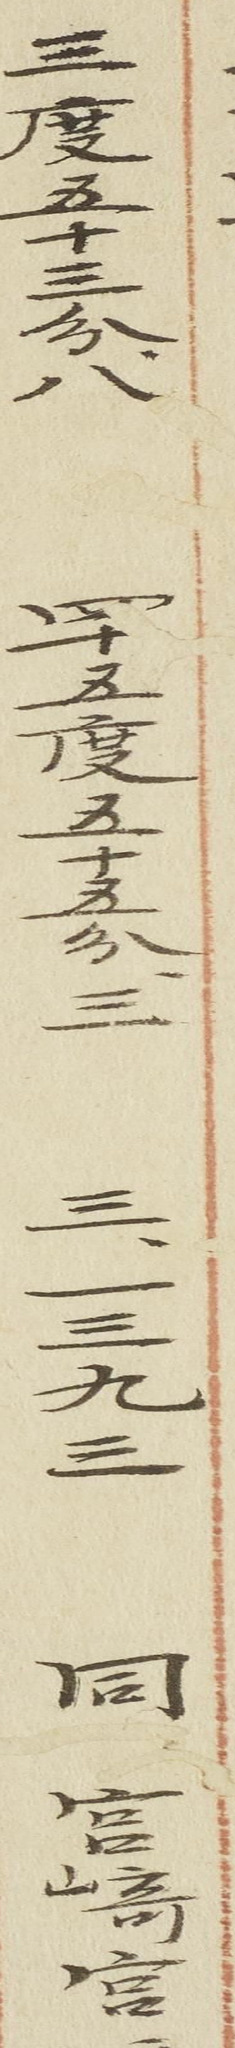三度五十三分、八四十五度五十五分、三三、一三九三同宮崎宮崎
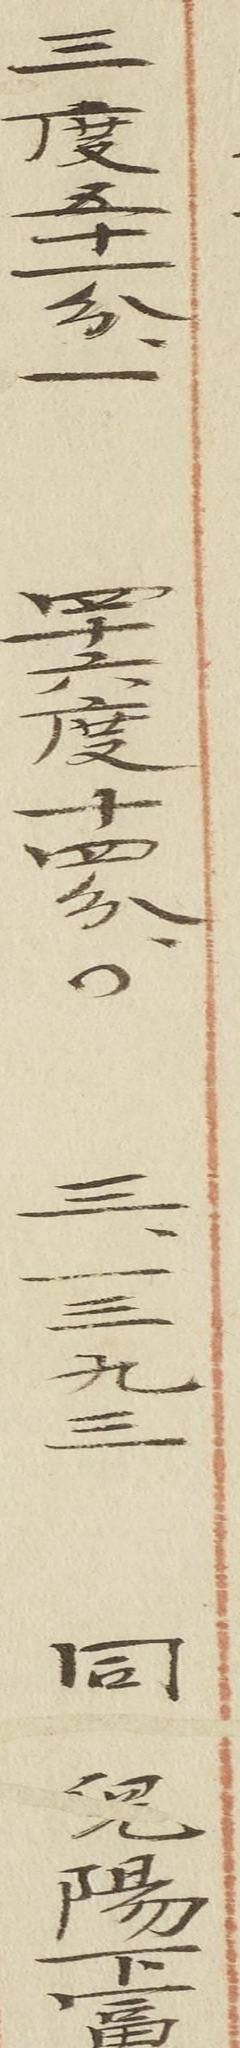三度五十一分、一四十六度十四分、〇三、一三九三同児陽下冨田
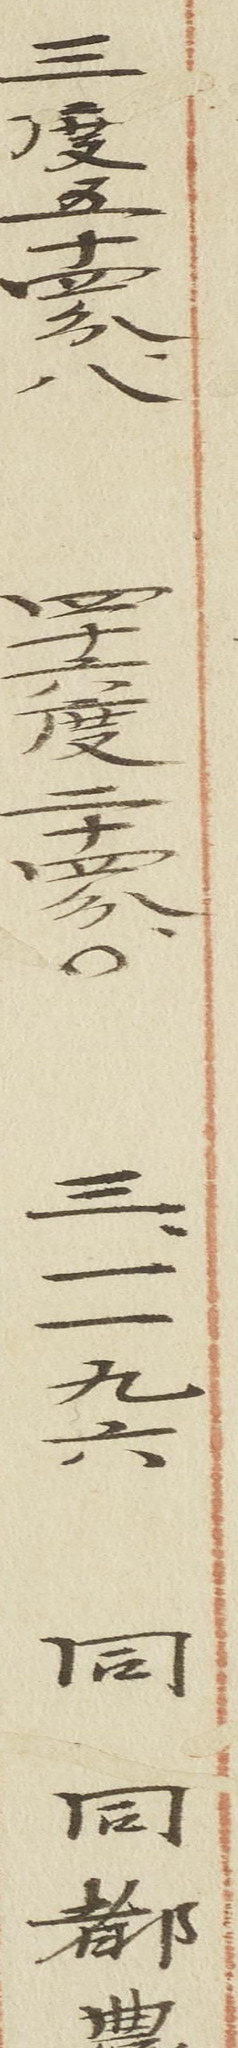三度五十四分、八四十六度二十四分、〇三、一一九六同同都農
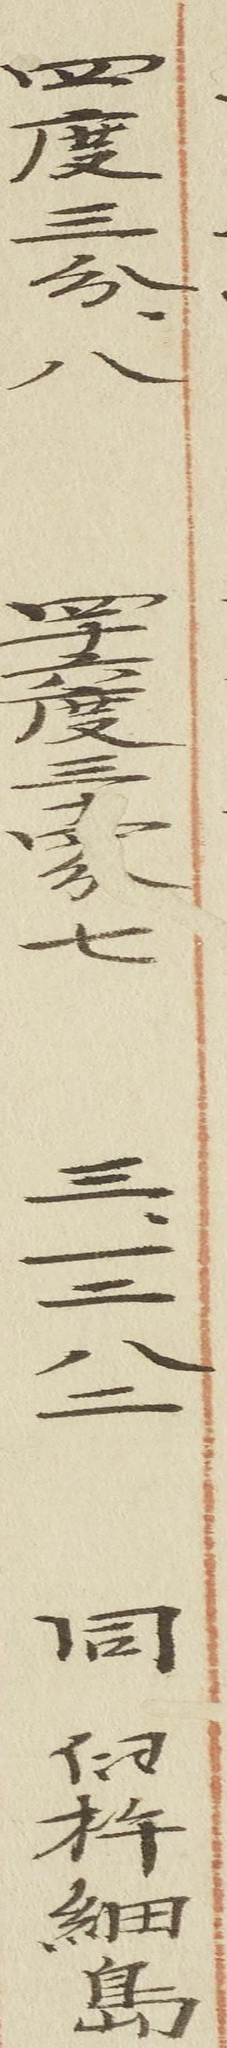四度三分、八四十六度三十四分、七三、一二八二同臼杵細島
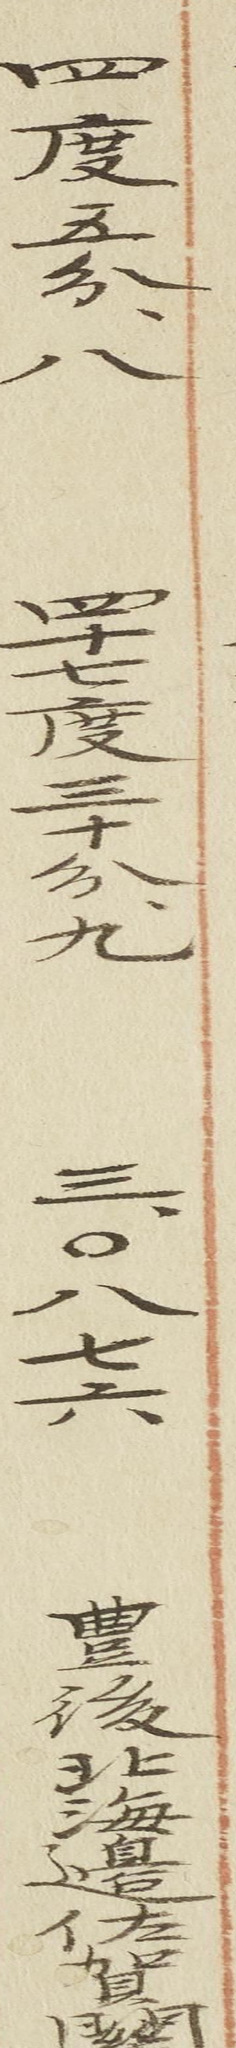四度五分、八四十七度三十分、九三、〇八七六豊後北海辺佐賀関
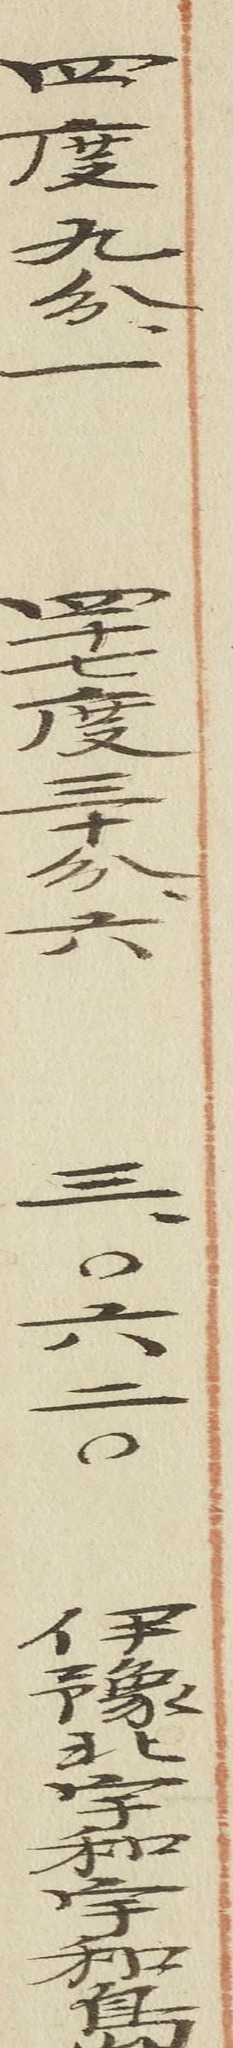四度九分、一四十七度三十分、六三、〇六二〇伊予北宇和宇和島
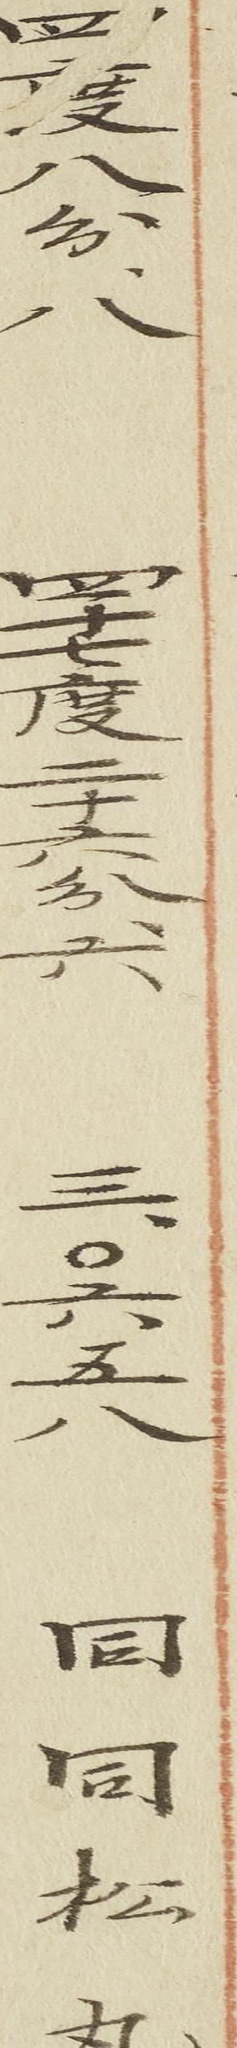四度八分、八四十七度二十六分、六三、〇六五八同同松丸
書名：鑷力観測報告
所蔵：東京大学地震研究所図書室 Earthquake Research Institute Library, The University of Tokyo, JAPAN
